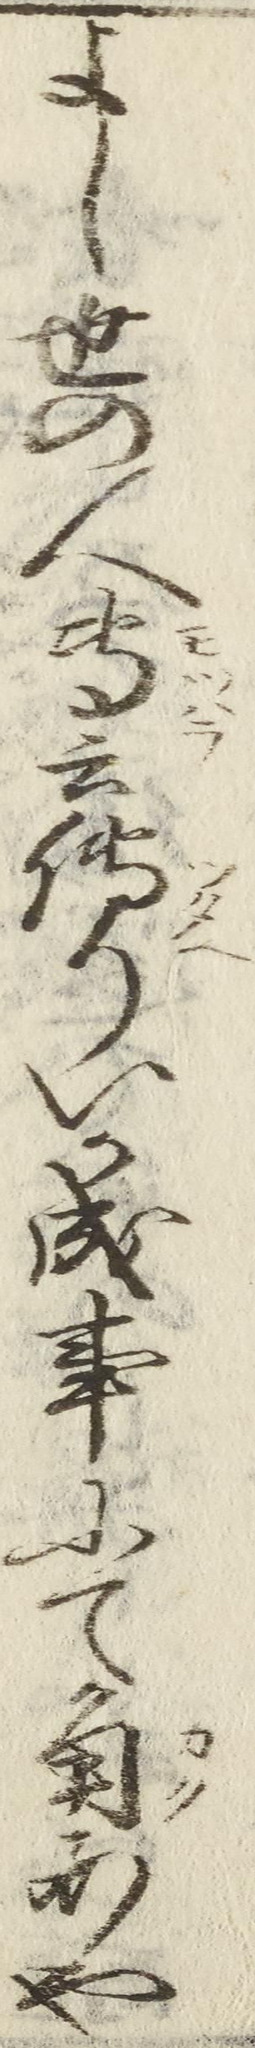よし世の人専云伝りいか成事にて角あや
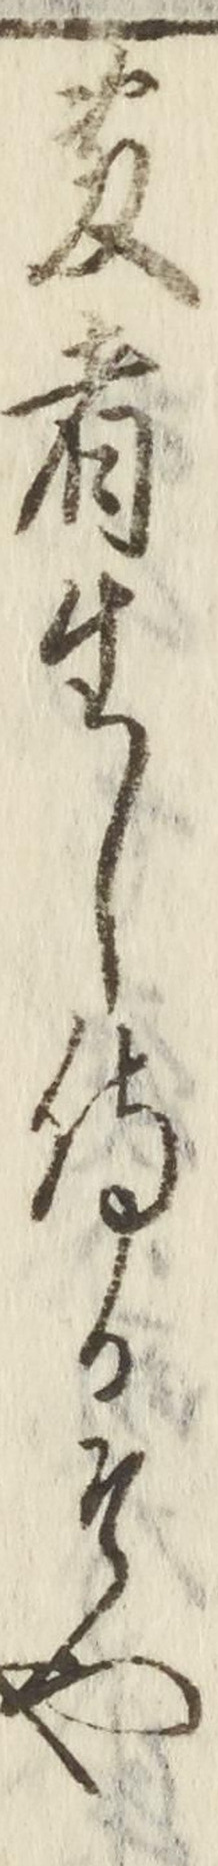敷者生し侍るそや
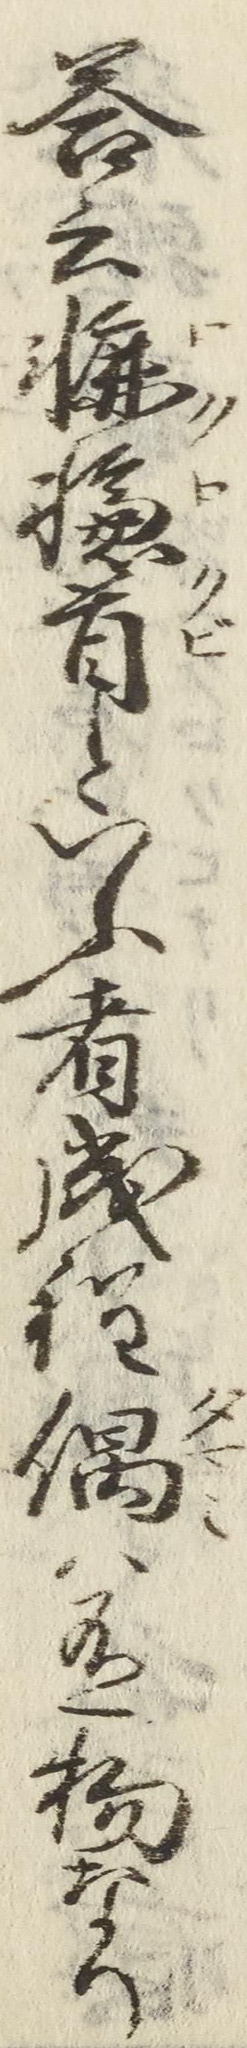答云轆轤首といふ者成程偶は有物なり
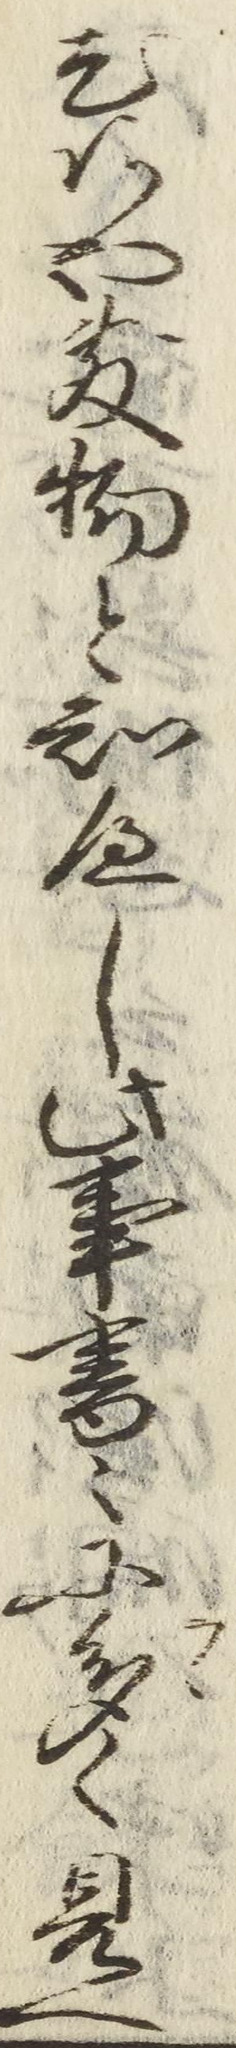尤あや敷物と知へし此事書々に多く見へ

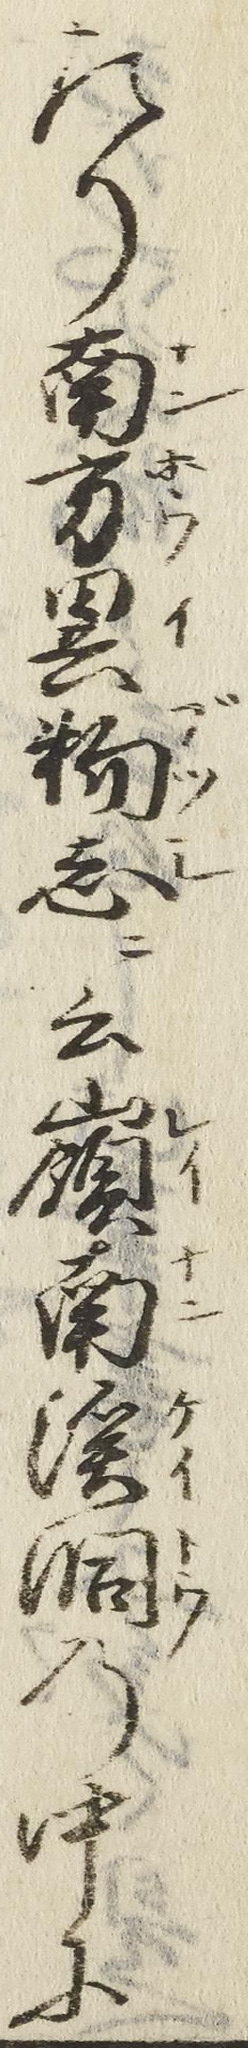たり南方異物志ニ云嶺南渓洞の中に
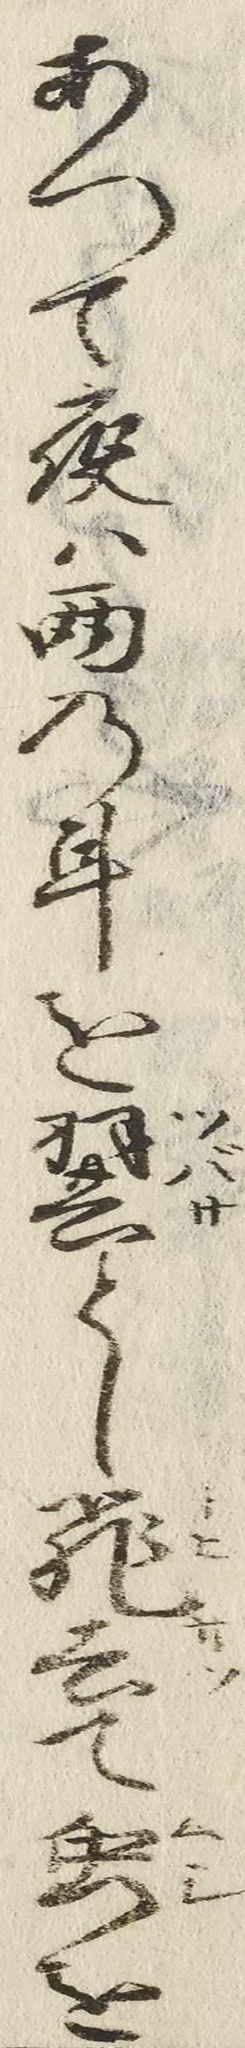あつて夜は両の耳を翼とし飛去て虫を
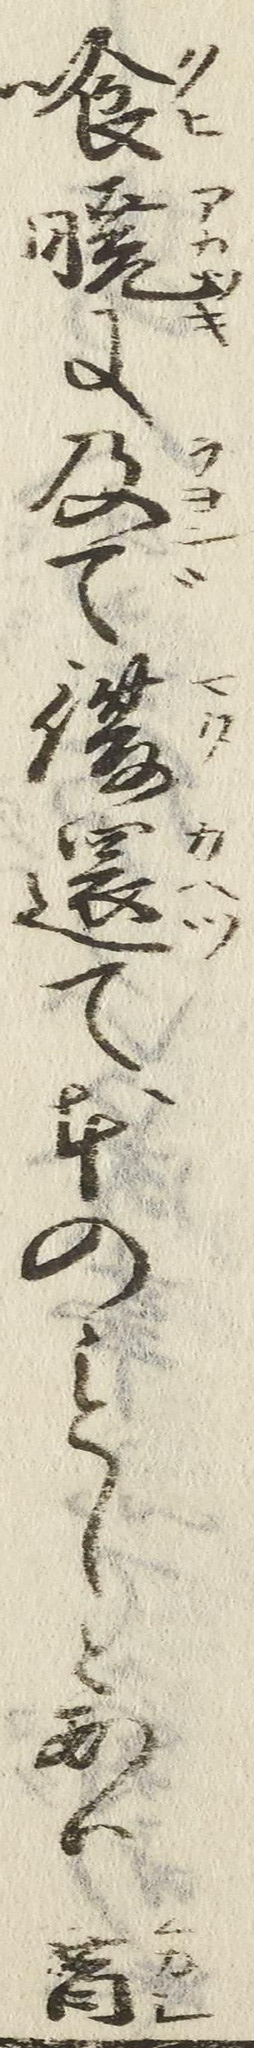喰暁に及で復還て本のことしとあり昔
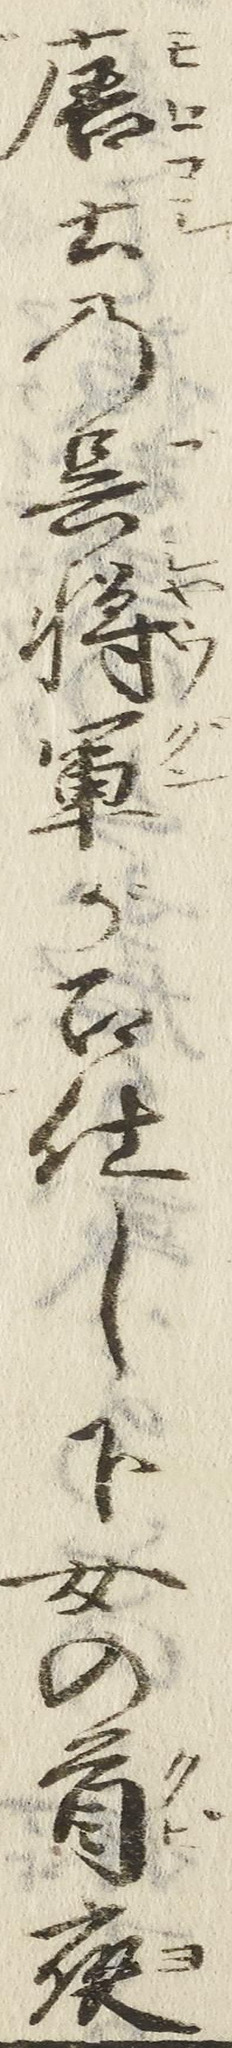唐土の呉将軍が召仕し下女の首夜
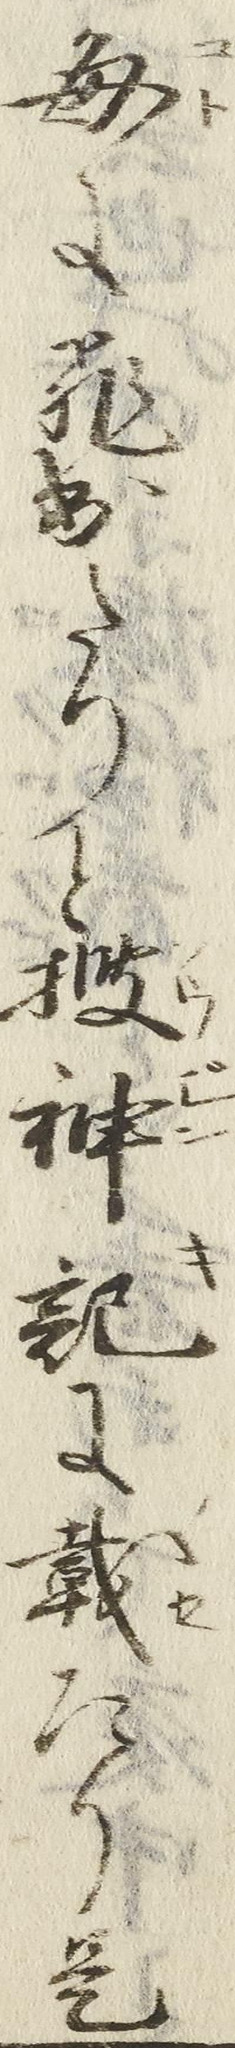毎に飛出たりと捜神記に載たり是
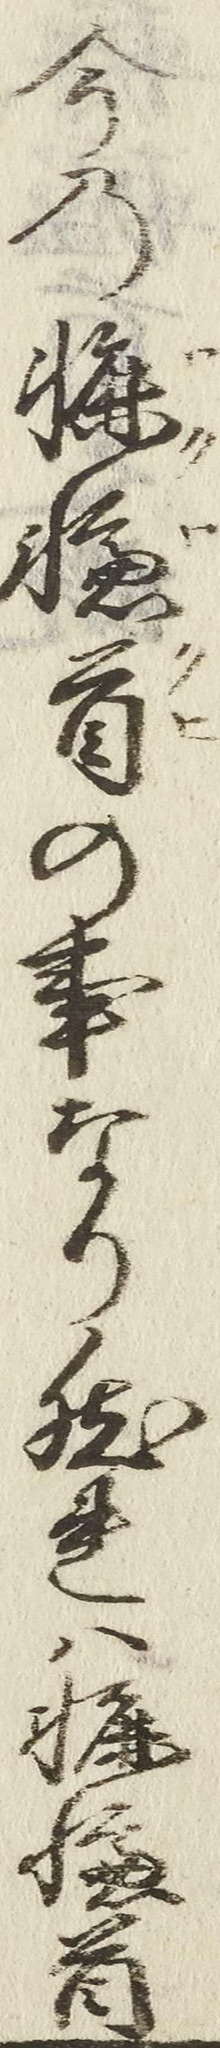今の轆轤首の事なり然れは轆轤首
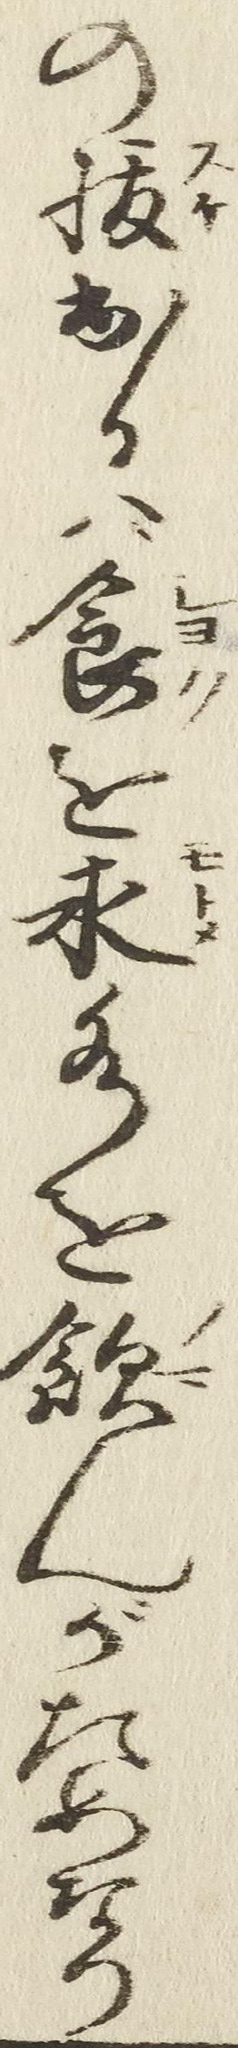の抜出るは食を求水を飲んがためなり
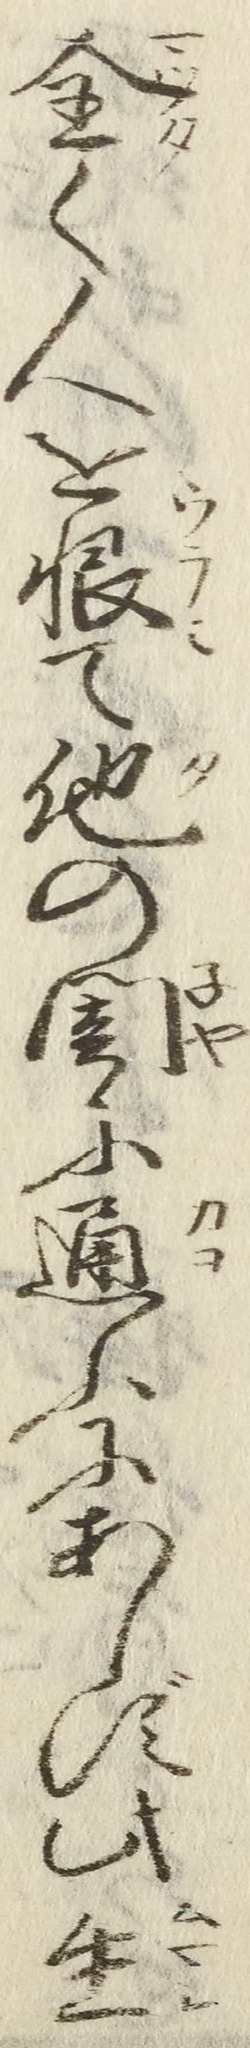全く人を恨て他の閨に通ふにあらず此生
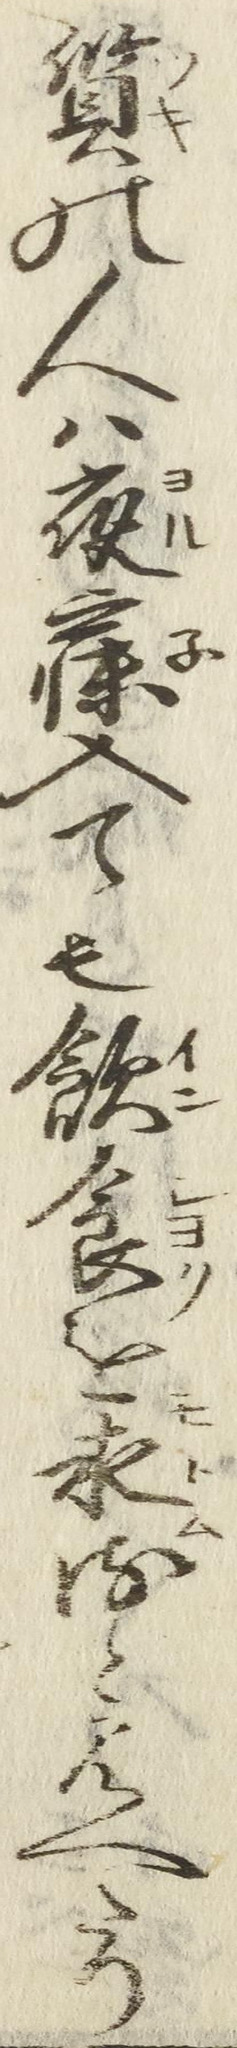質の人は夜寝入ても飲食を求ると見へたり
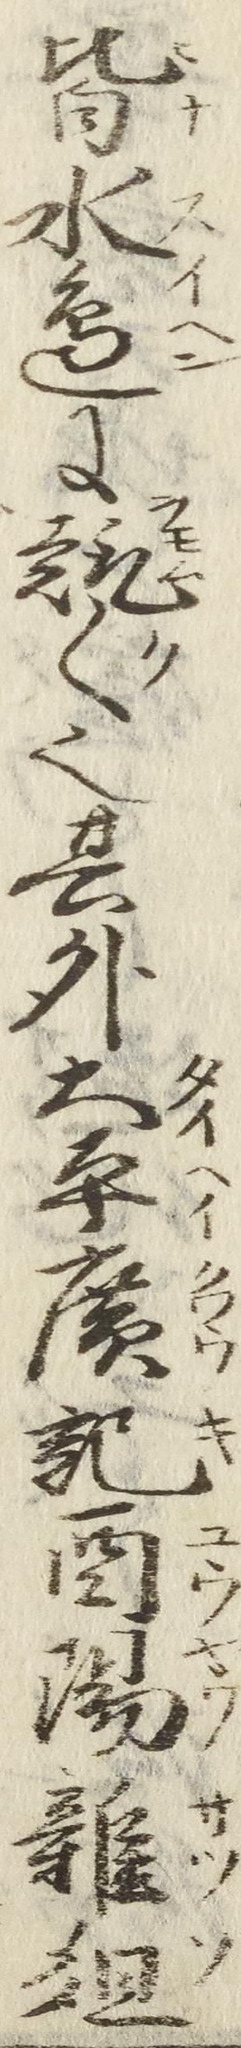皆水辺に趣く也其外大平広記酉陽雑俎
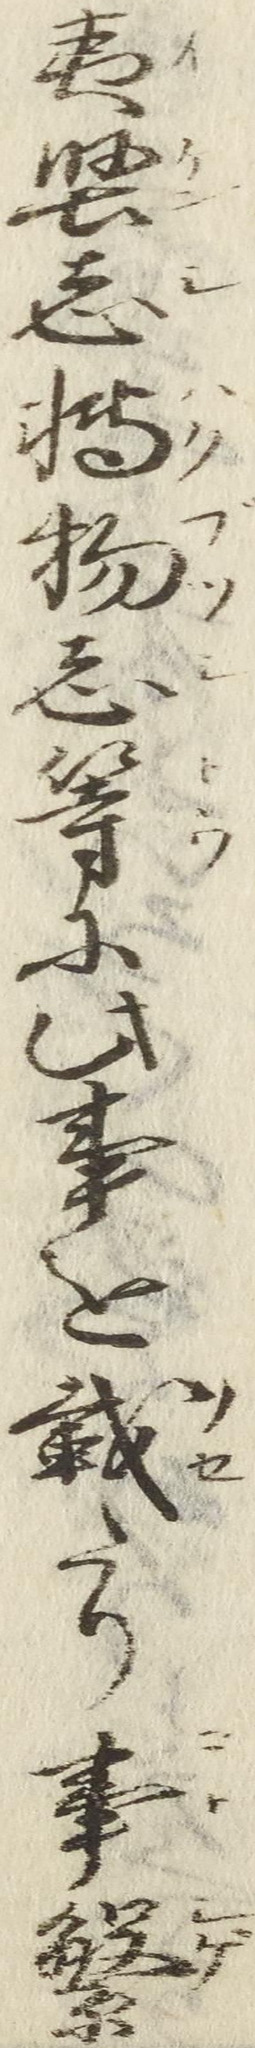夷堅志博物志等に此事を載たり事繁
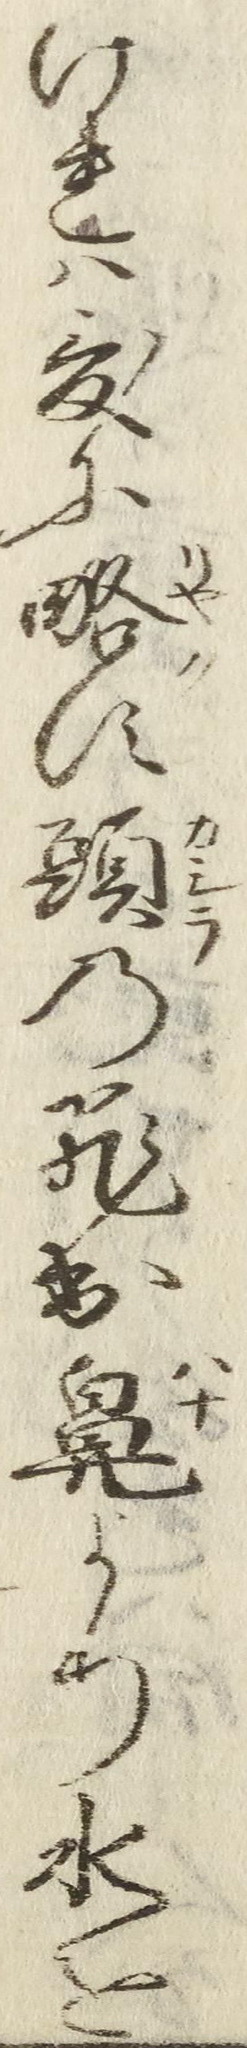けれは爰に略す頭の飛出鼻より水を
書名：天地或問珍　地
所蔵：東京大学地震研究所図書室 Earthquake Research Institute Library, The University of Tokyo, JAPAN
